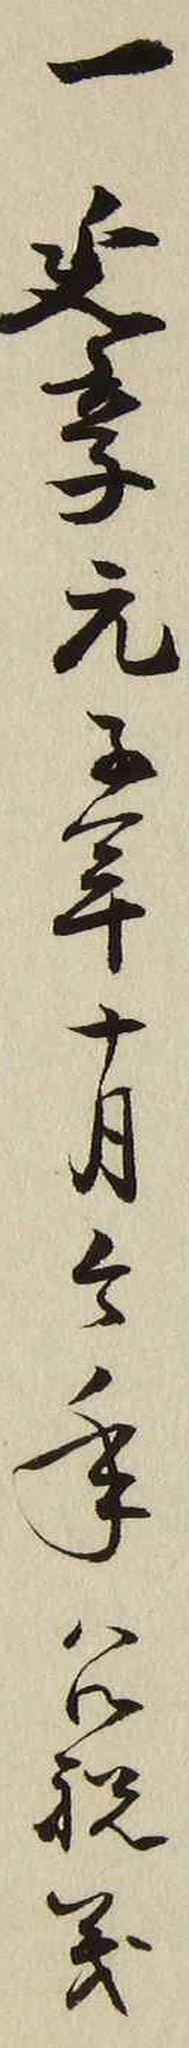一延享元子年十月今年は御祝儀
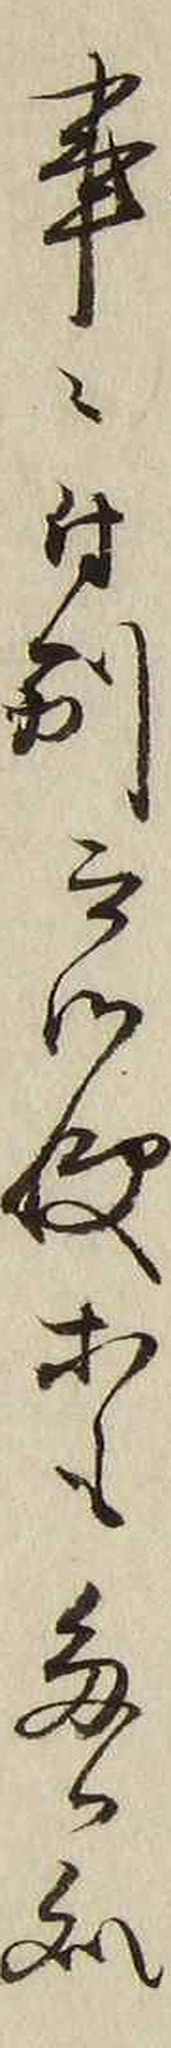事には別而御使等も多候処
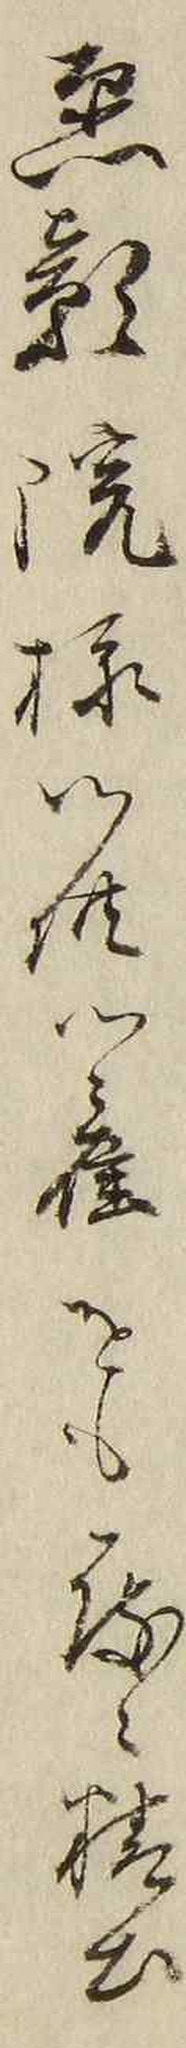愿顔院様御供御雇をも致候精出

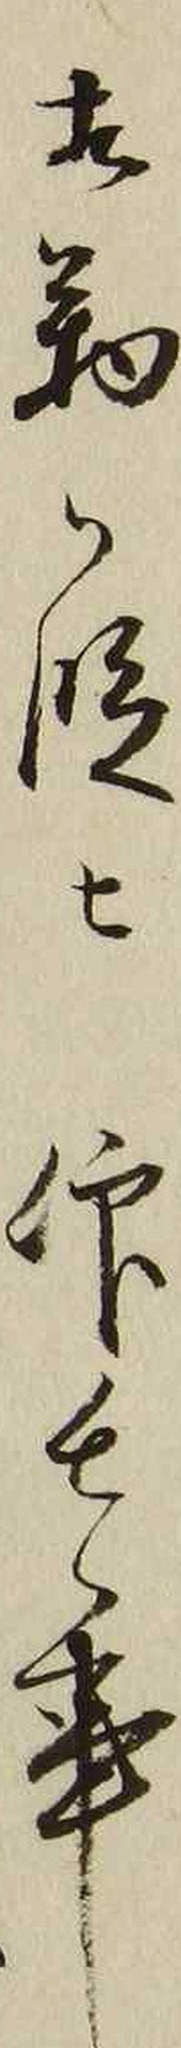相勤候段被仰出候事
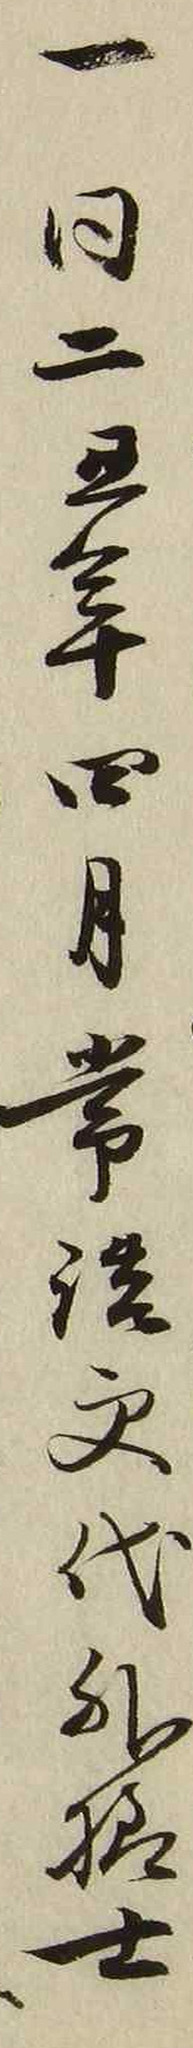一同二丑年四月常詰交代外様士
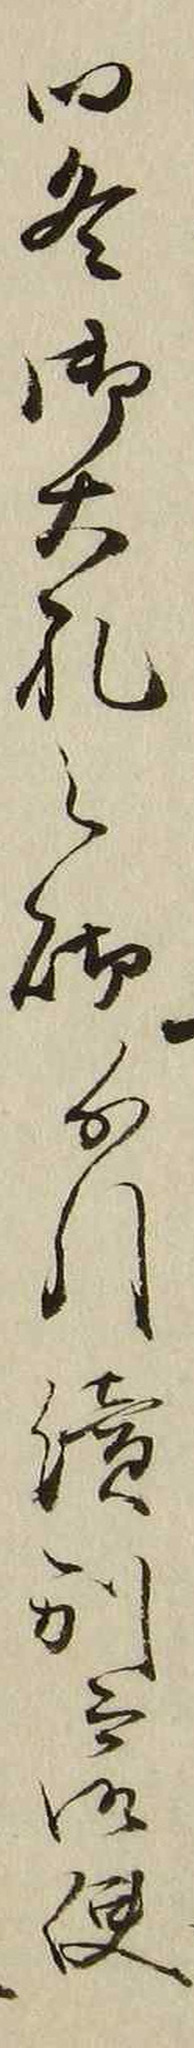旧冬御大礼之砌ゟ引続別而御使
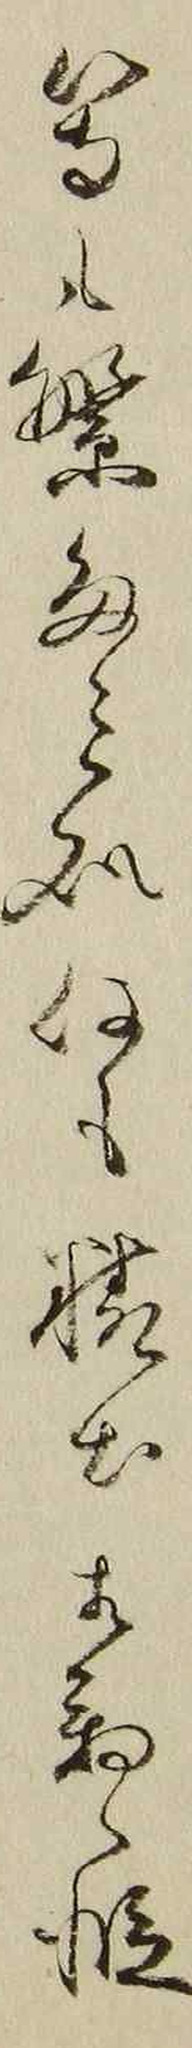等も繁多に候処何も精出相勤候段
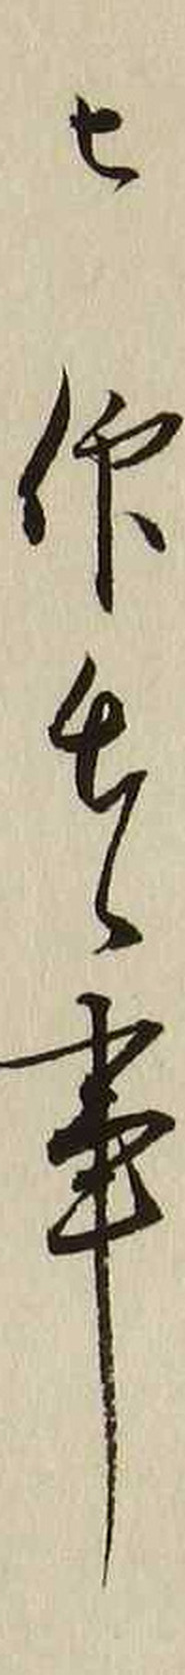被仰出候事
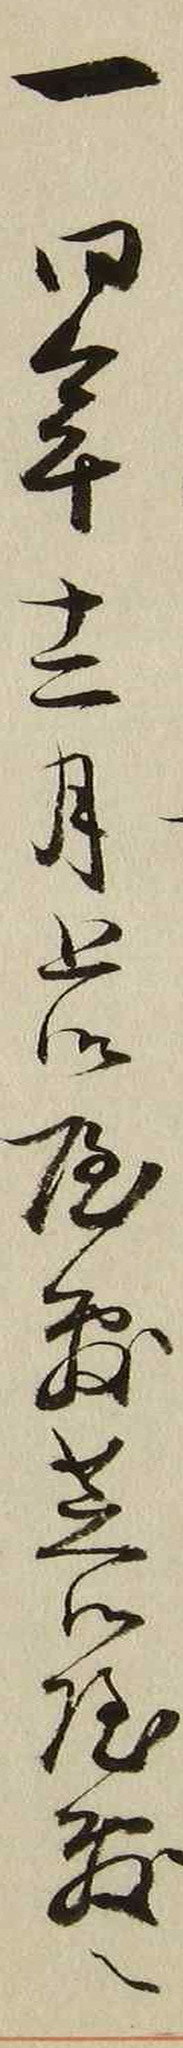一同年十二月上御屋敷芝御屋敷へ
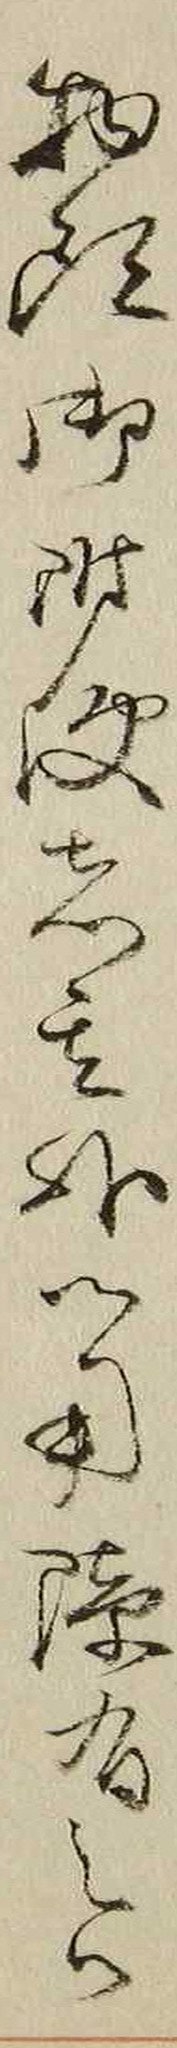物頭御附使者其外御用障有之候
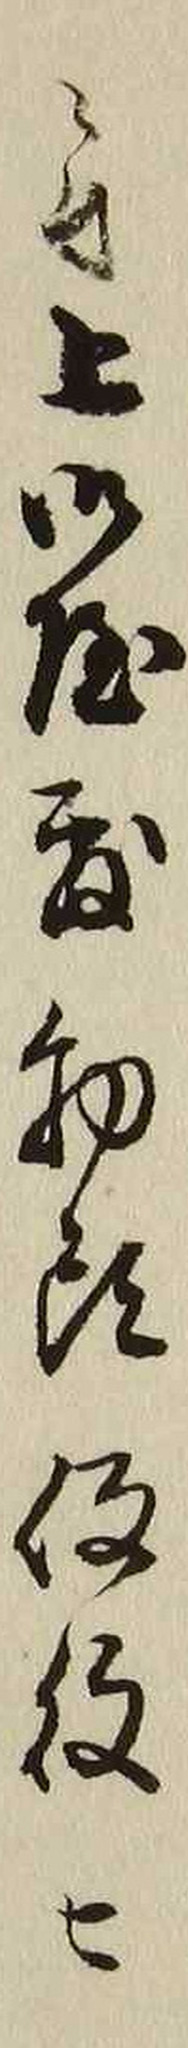に付上御屋敷物頭仮役被
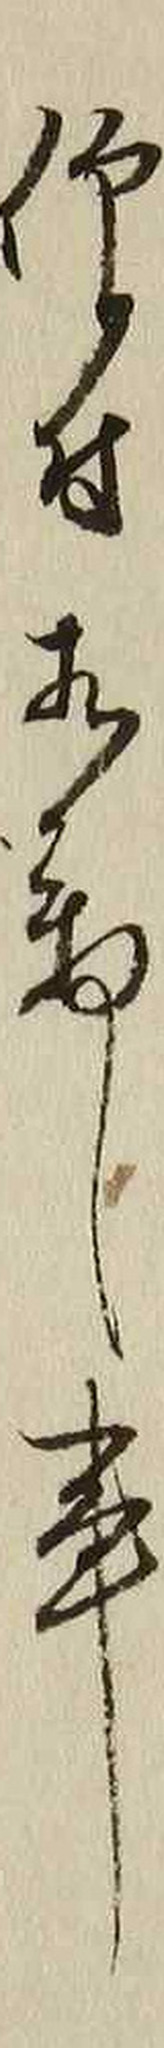仰付相勤候事
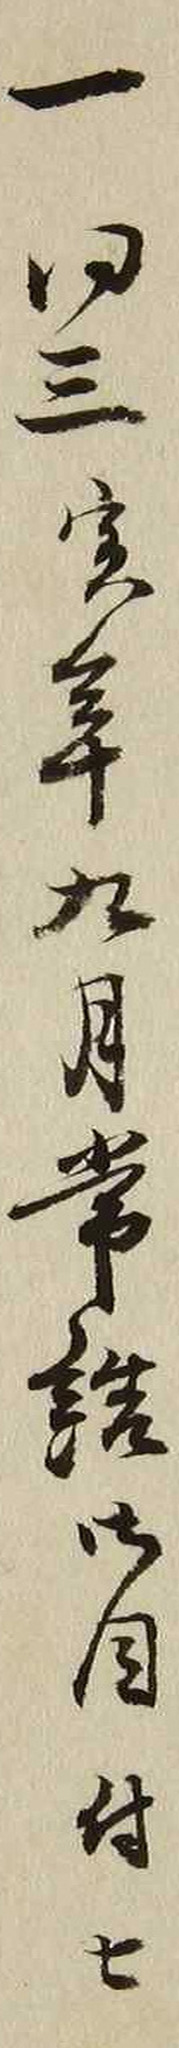一同三寅年九月常詰御目付被
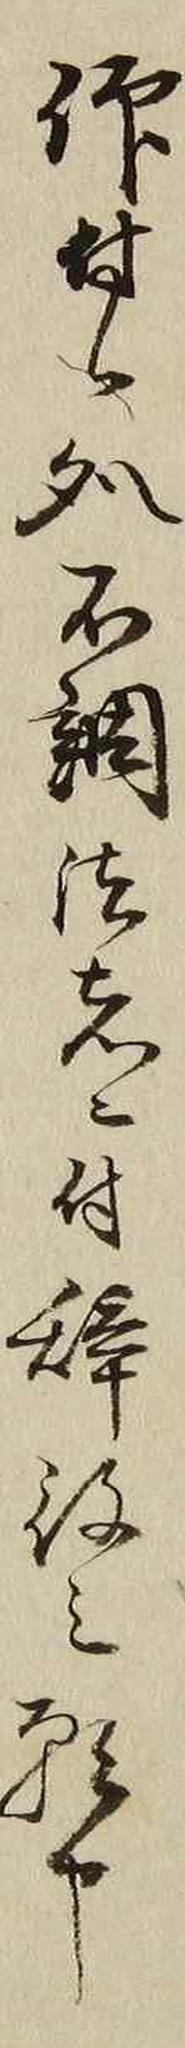仰付候処不調法に付辞役之願申
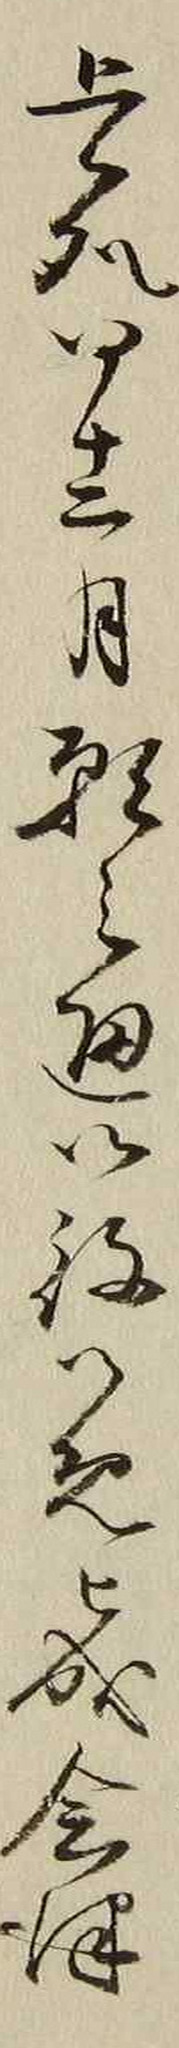上候処同十二月願之通御役御免被成会津
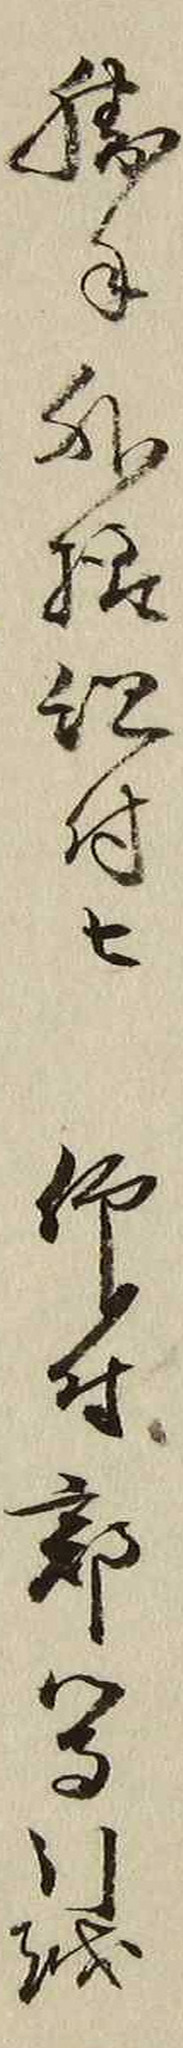勝手外様組付被仰付郎当引越
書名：諸士系譜　巻之292　き之部1
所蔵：会津若松市立会津図書館
